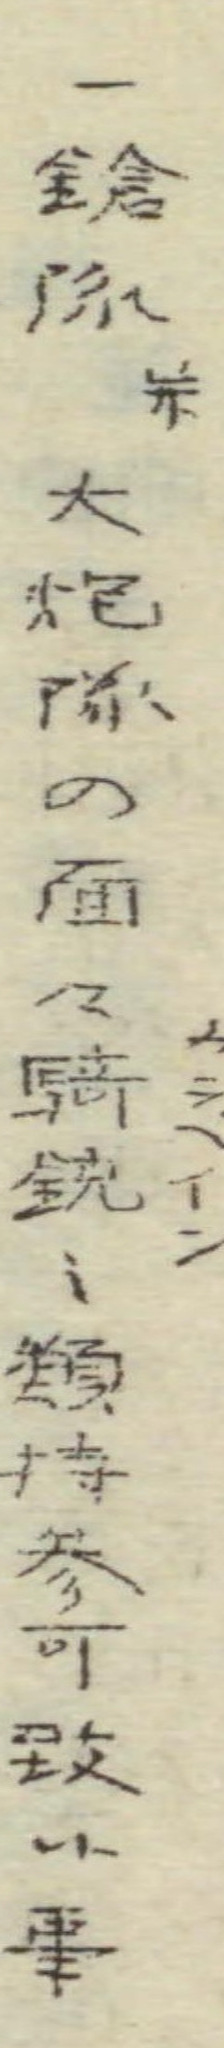一鎗隊并大炮隊の面々騎銃之類持参可致候事
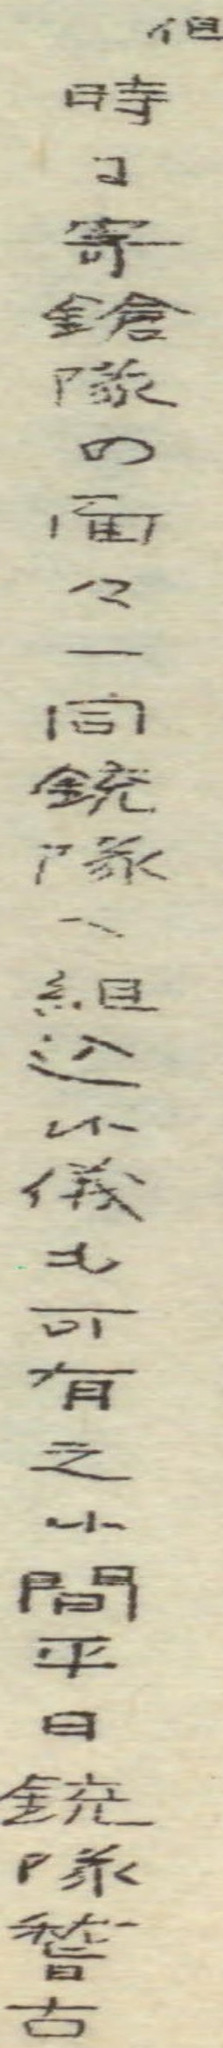但時に寄鎗隊の面々一同銃隊へ組込候義も有之候間平日銃隊稽古
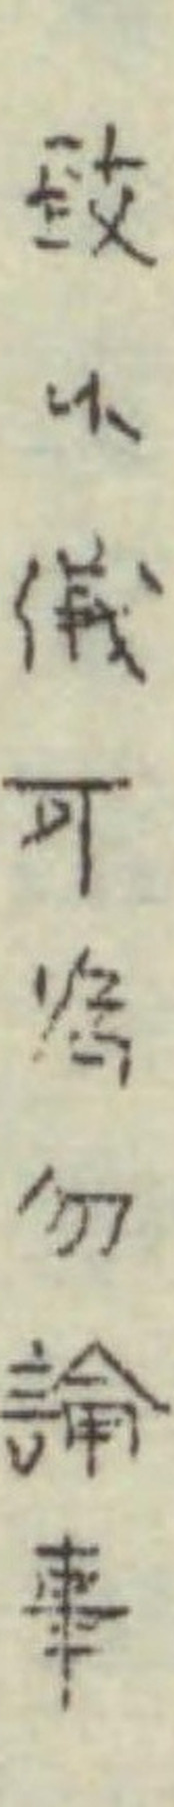致候儀可為勿論事
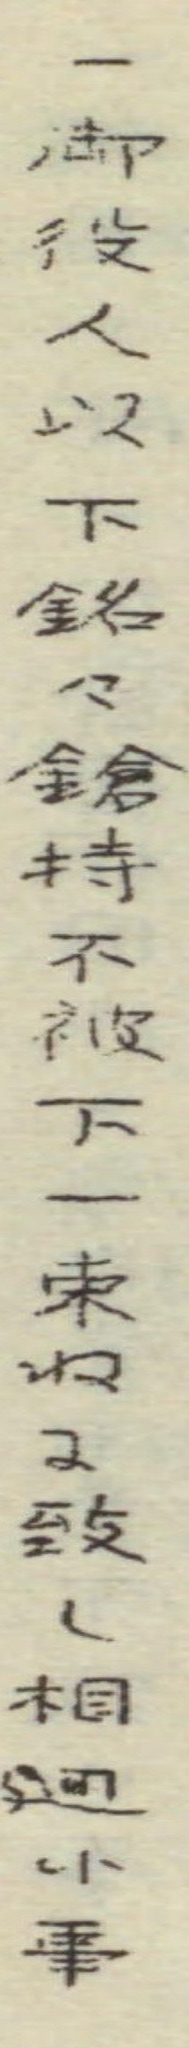一御役人以下銘々鎗持不被下一束ねに致し相廻候事
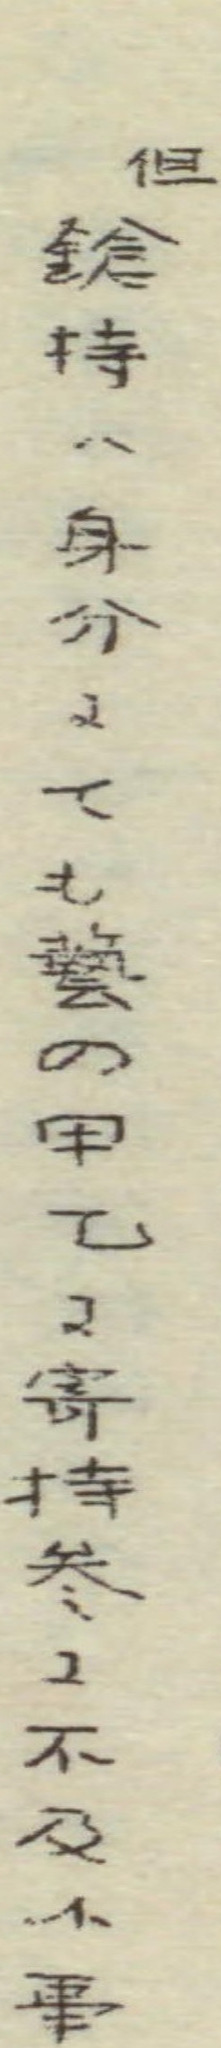但鎗持ハ身分にても芸の甲乙に寄持参に不及候事
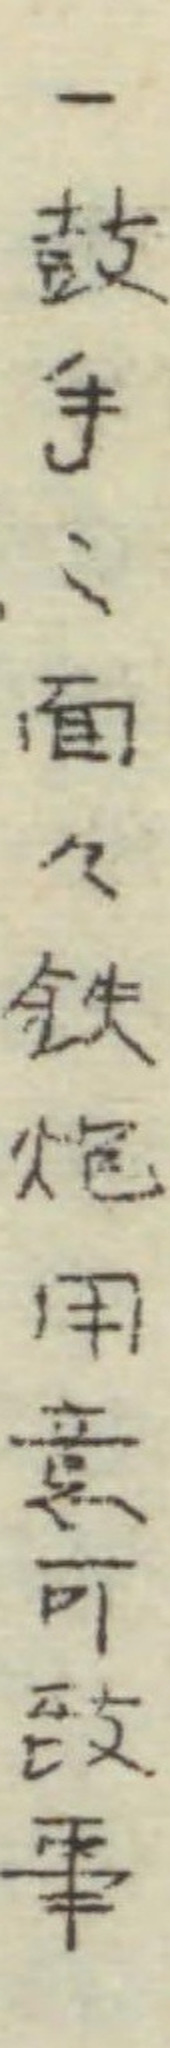一鼓手之面々て鉄炮用意可致事
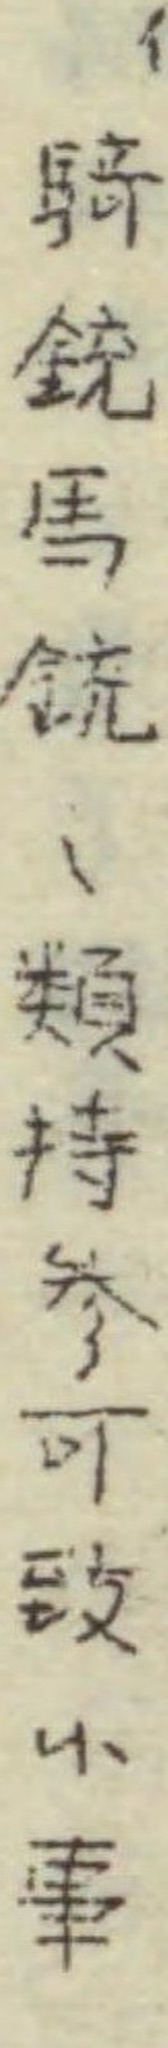但騎銃馬銃之類持参可致候事
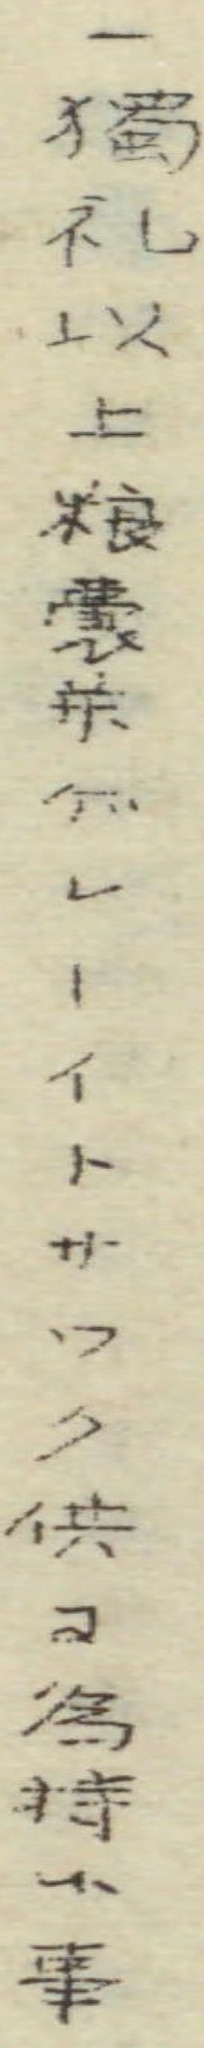一独礼以上粮嚢并ゲレーイトサック供に為持候事
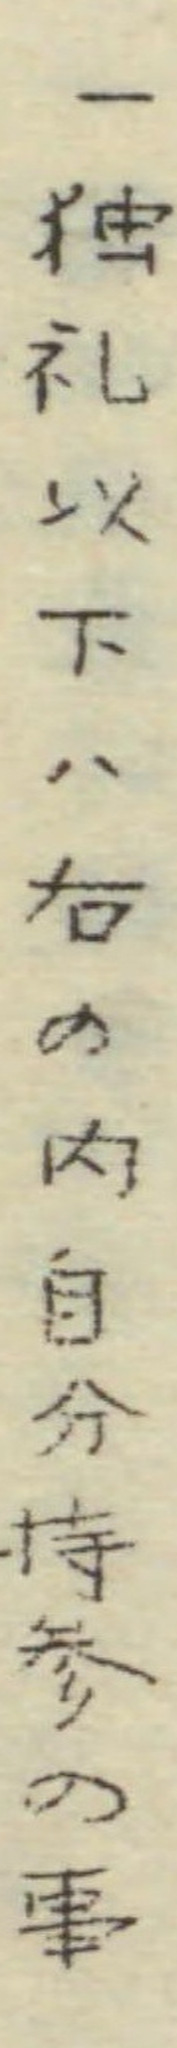一独礼以下ハ右の内自分持参の
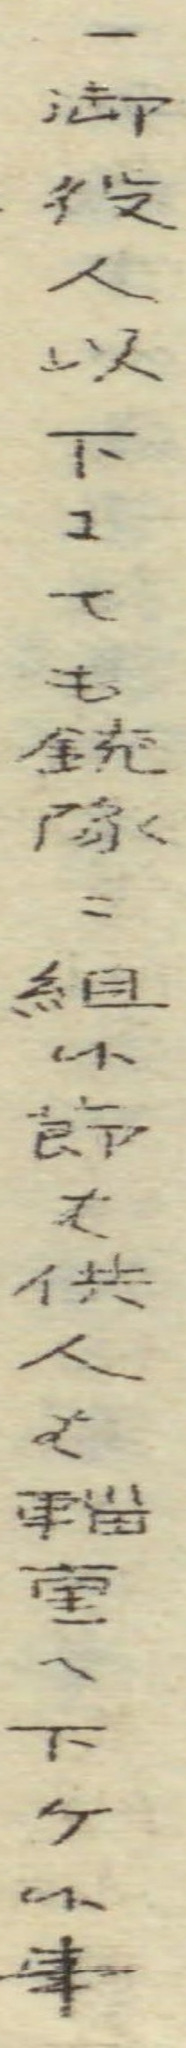一御役人以下にても銃隊に組候節は供人は輜重へ下ヶ候事
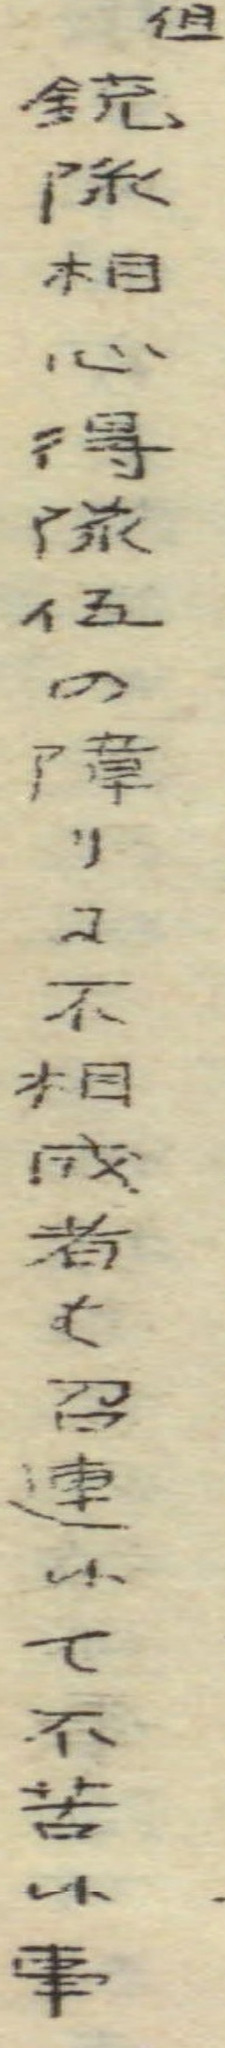但銃隊相心得隊伍の障りに不相成者は召連候て不苦候事

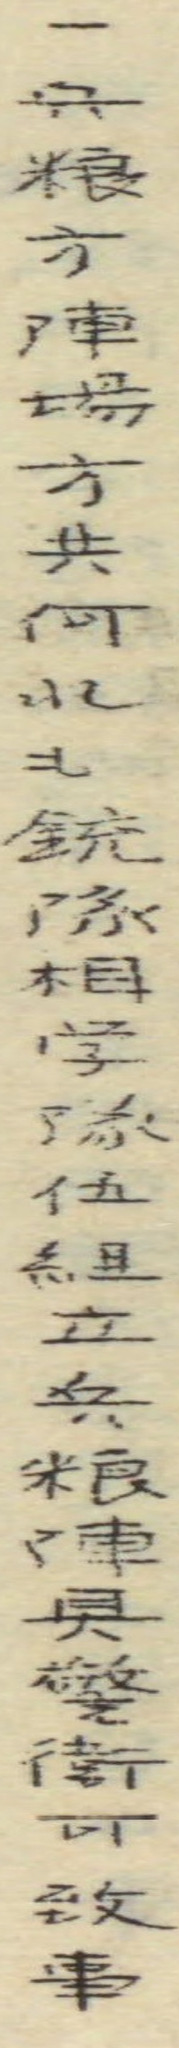一兵粮方陣場方何れも銃隊相学隊伍組立兵粮陣具警衛可致事
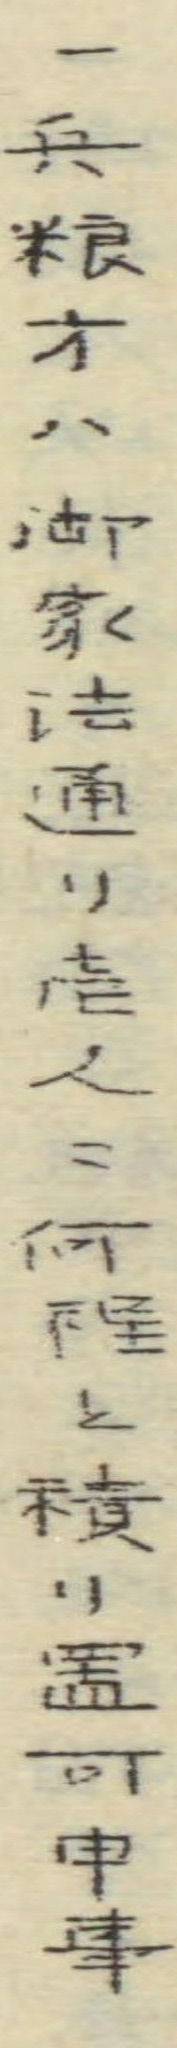一兵粮方ハ御火家法通り壱人二何程と積り置可申事
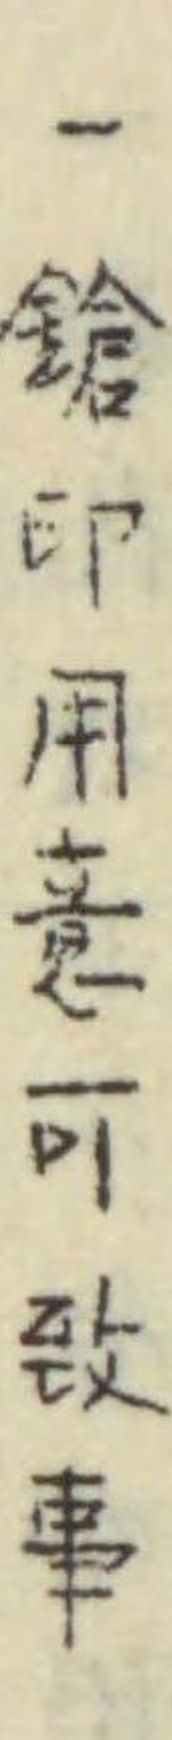一鎗印用意可致事
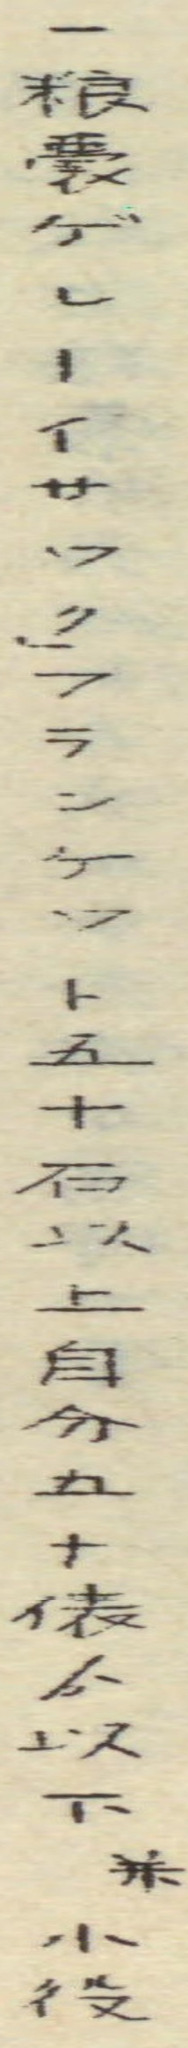一粮嚢ゲレートイサツク」フランケット五十石以上自分五十俵ゟ以下并小役
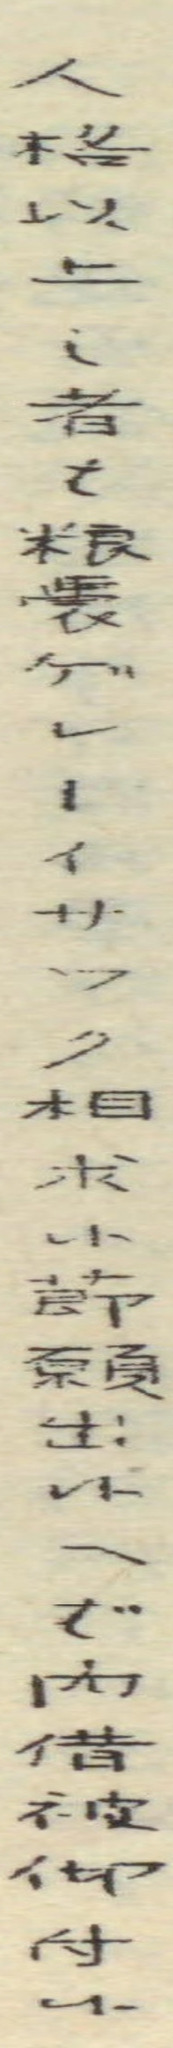人格以上之者も糧嚢ゲレートイサツク相求候節願出候へば内借被仰付候
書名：三河吉田藩動員史料
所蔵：国立国会図書館 National Diet Library, JAPAN
